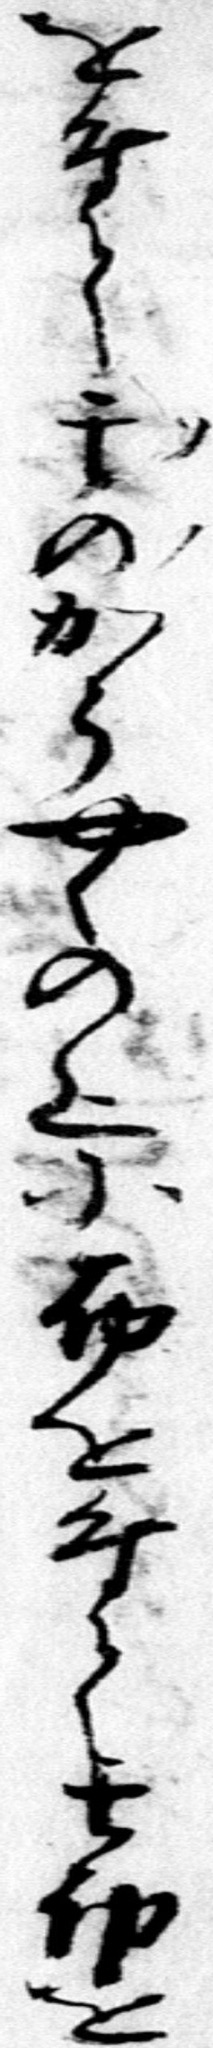を付て其のかうやくの上に布を付て其布を
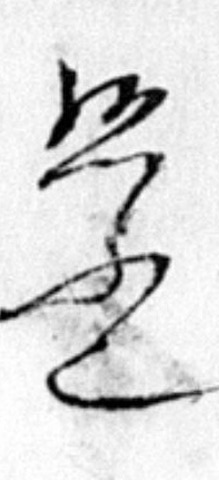ぬふ也
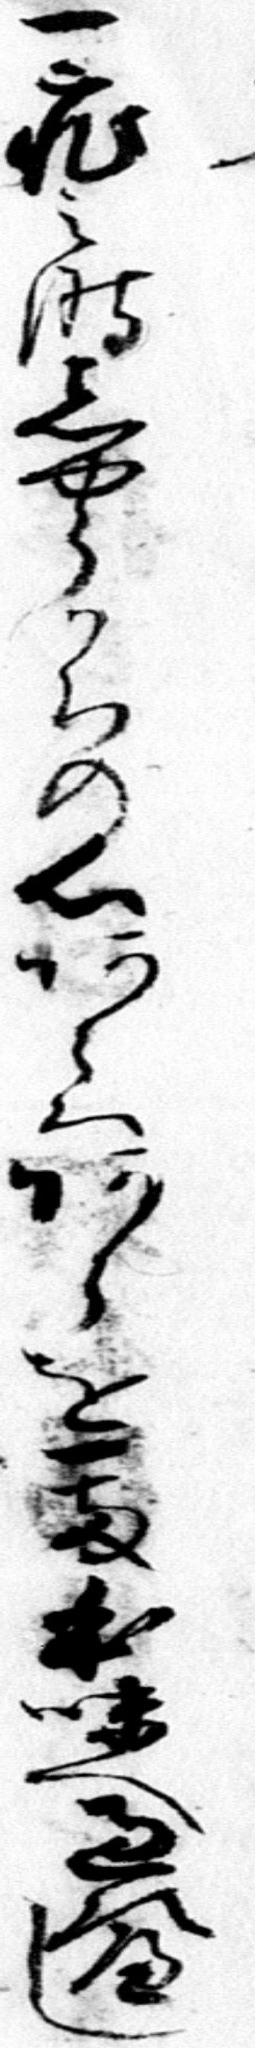一疵の時しやうかちの心あらはあらを一両本味へ過んへし
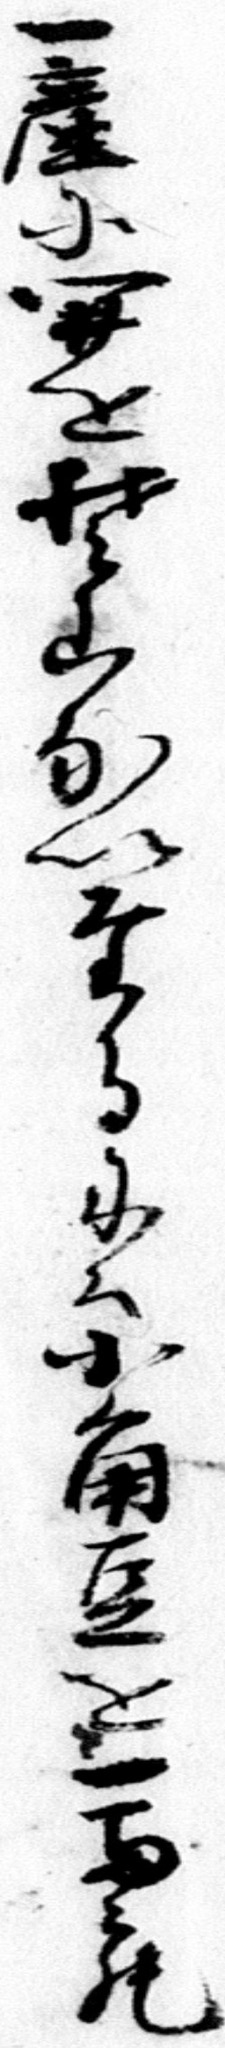一産に開をそこないたるには小角豆を一両宛
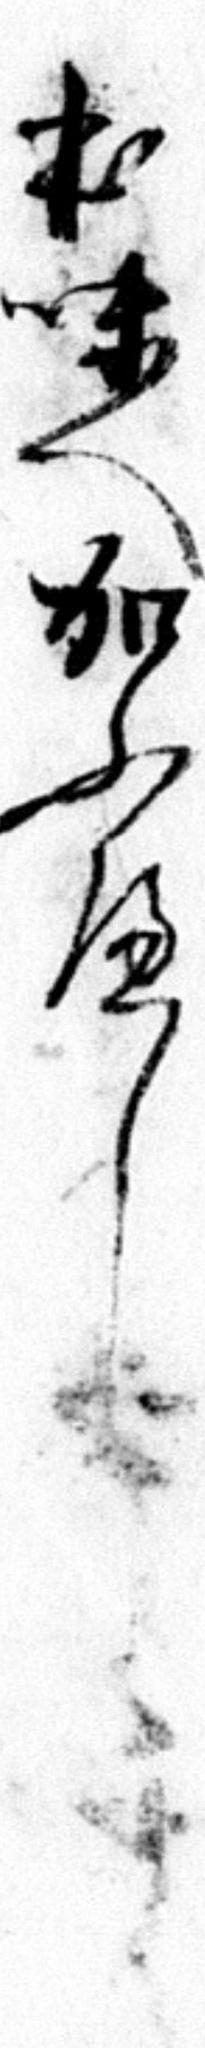本味へ加ふへし
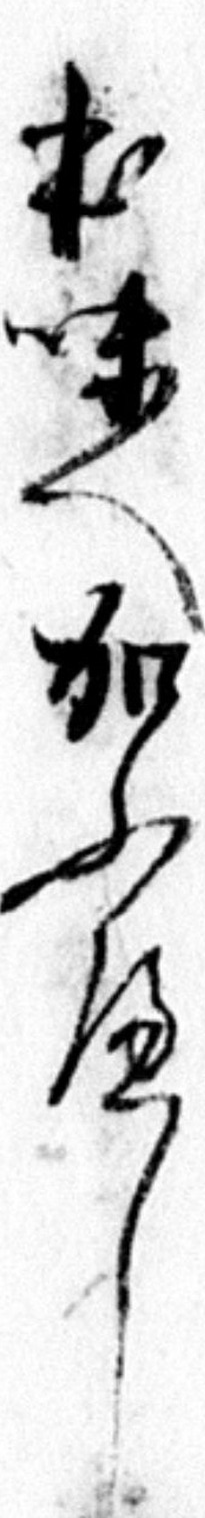本味へ加ふへし
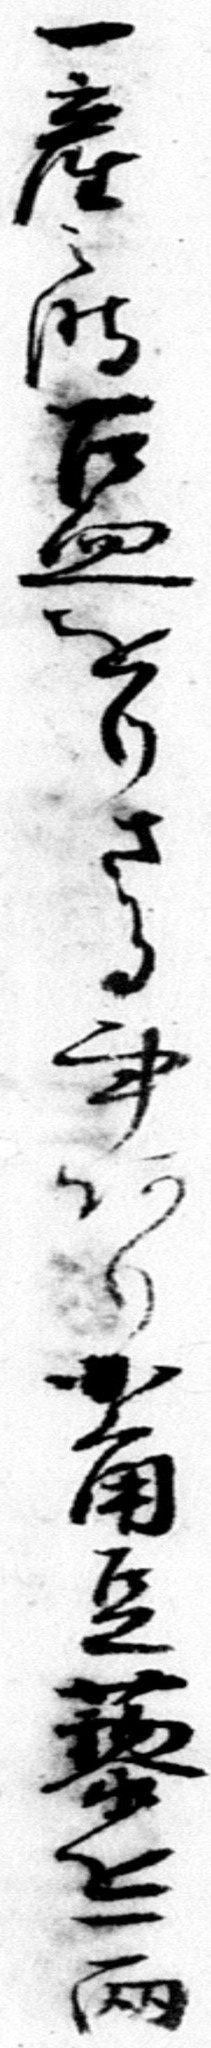一産の時古血をりさる事あり小角豆藜を一両
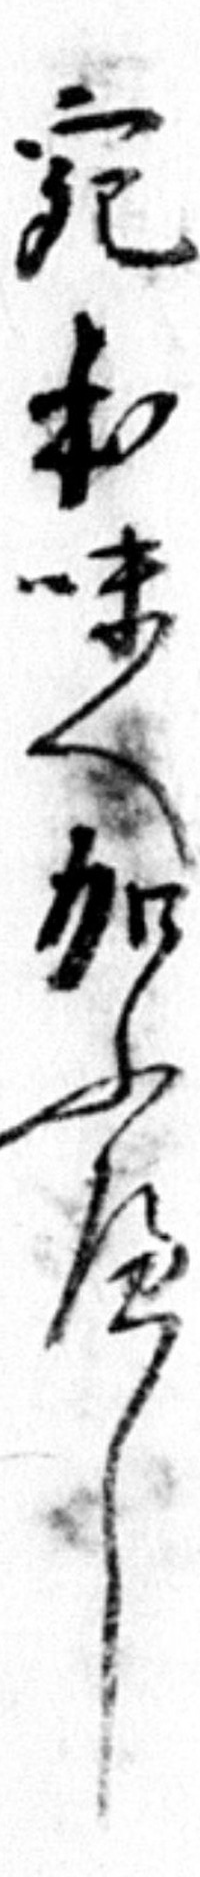宛本味へ加ふへし
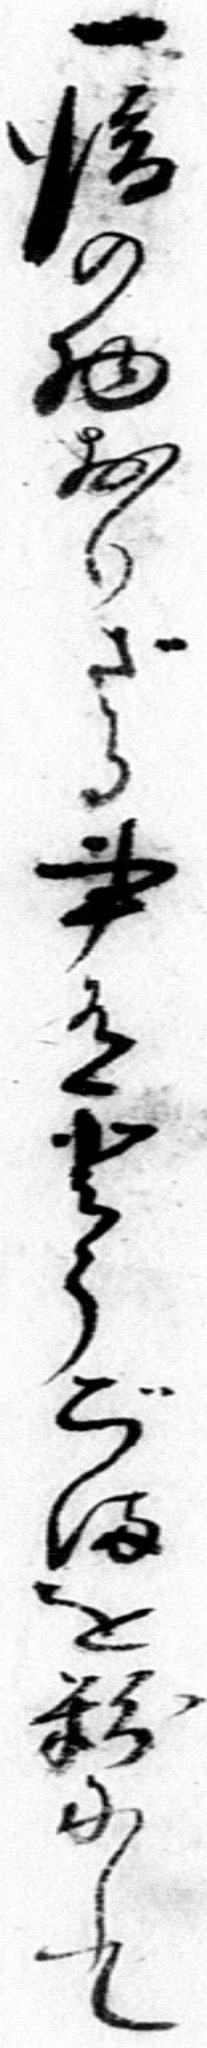一後の物おりざる事有とうごまを粉にして
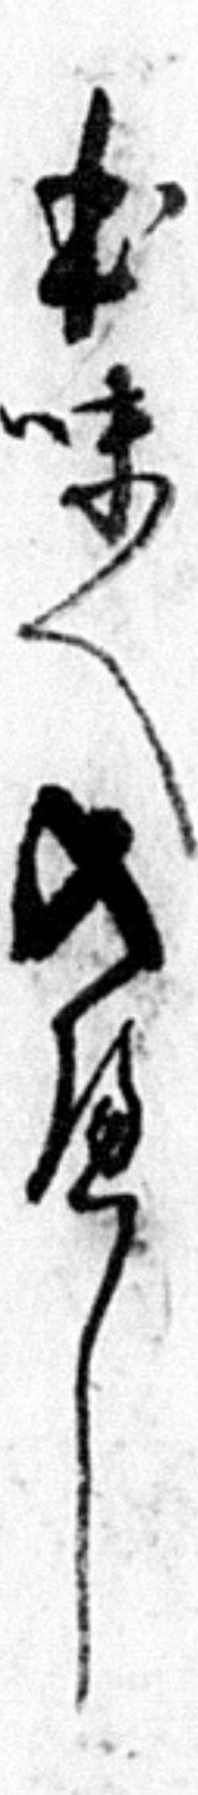本味へ入へし
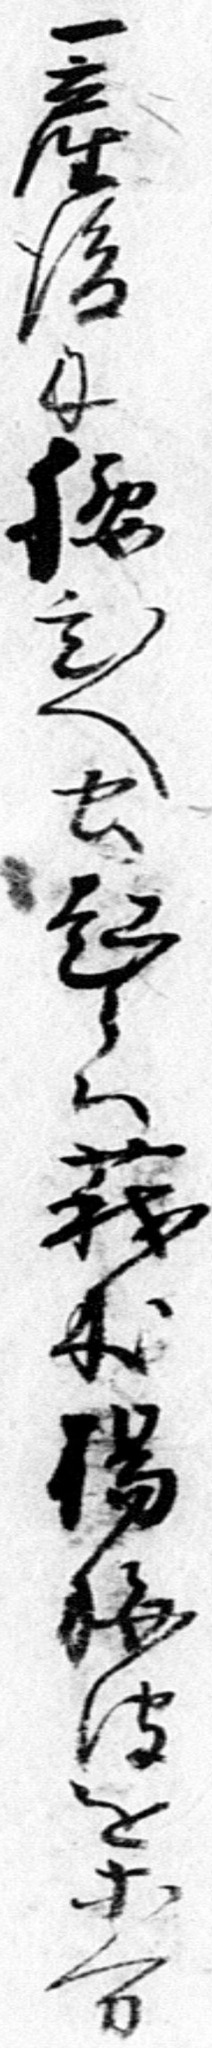一産語に腰ひへ虫起らは萩木楊梅皮を等分
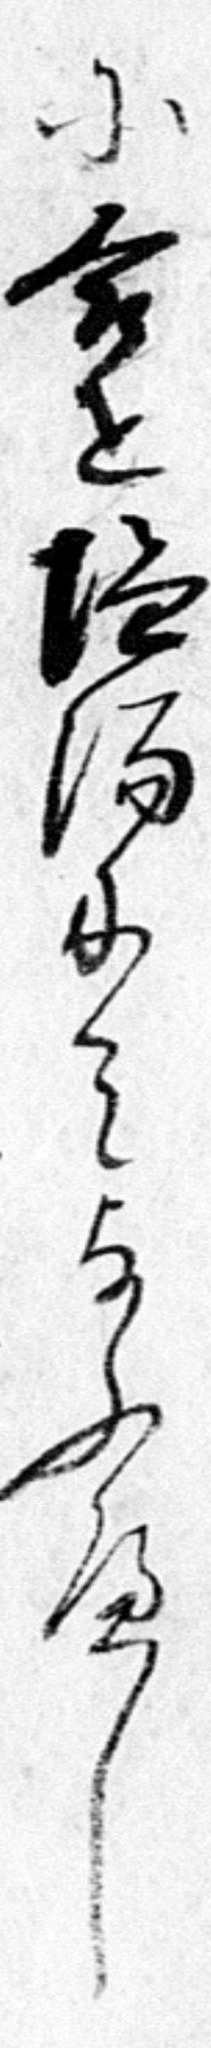に合せ塩湯にて与ふへし
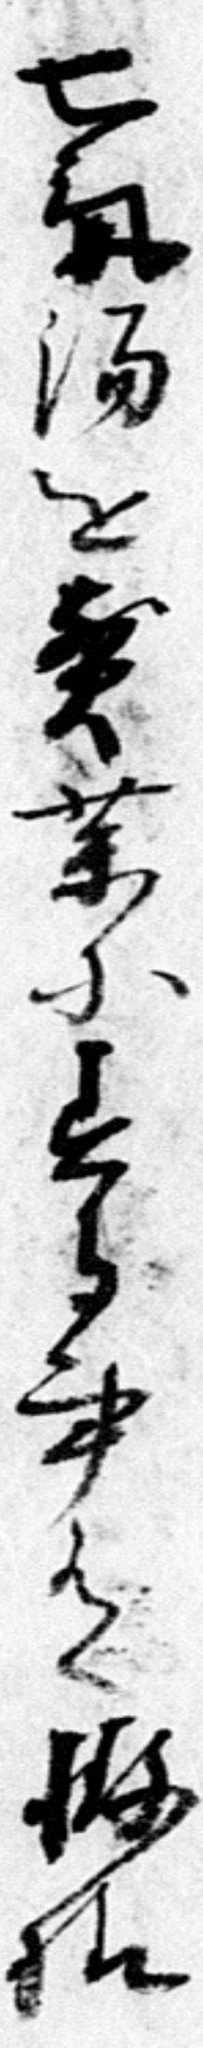七気湯を煎薬にする事有拵様
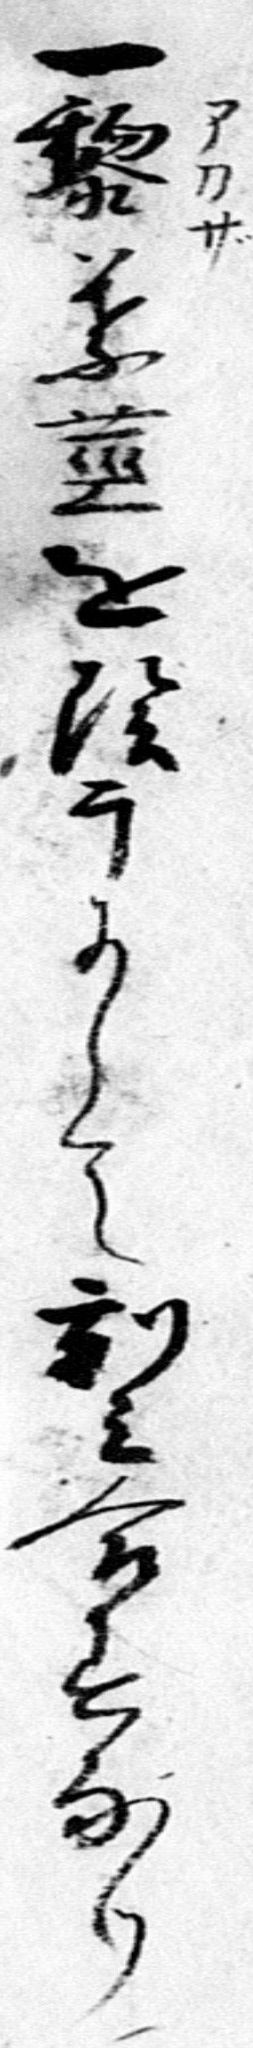一藜葉茎を陰干にして刻み合すなり
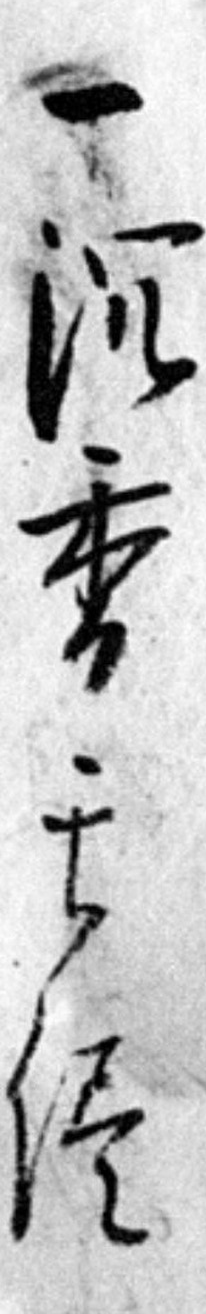一沈香其侭
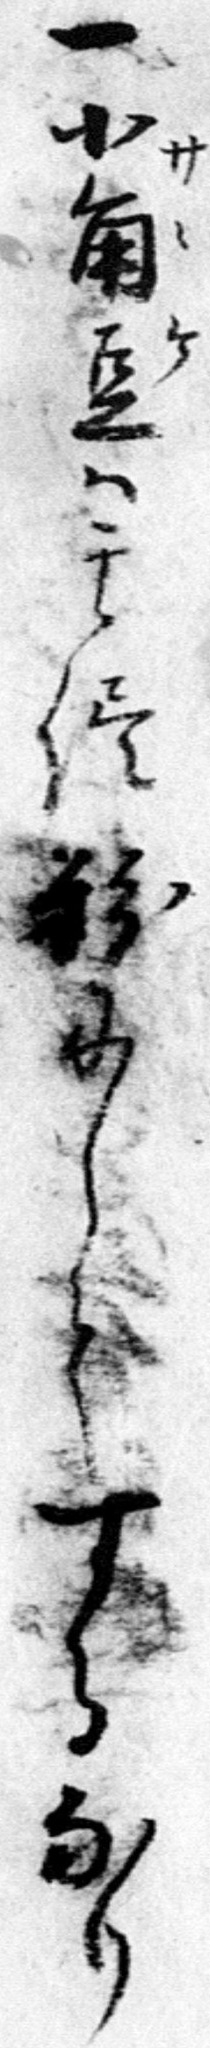一小角豆は其侭粉にしてするなり
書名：名薬秘伝之書
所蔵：徳島県立図書館
